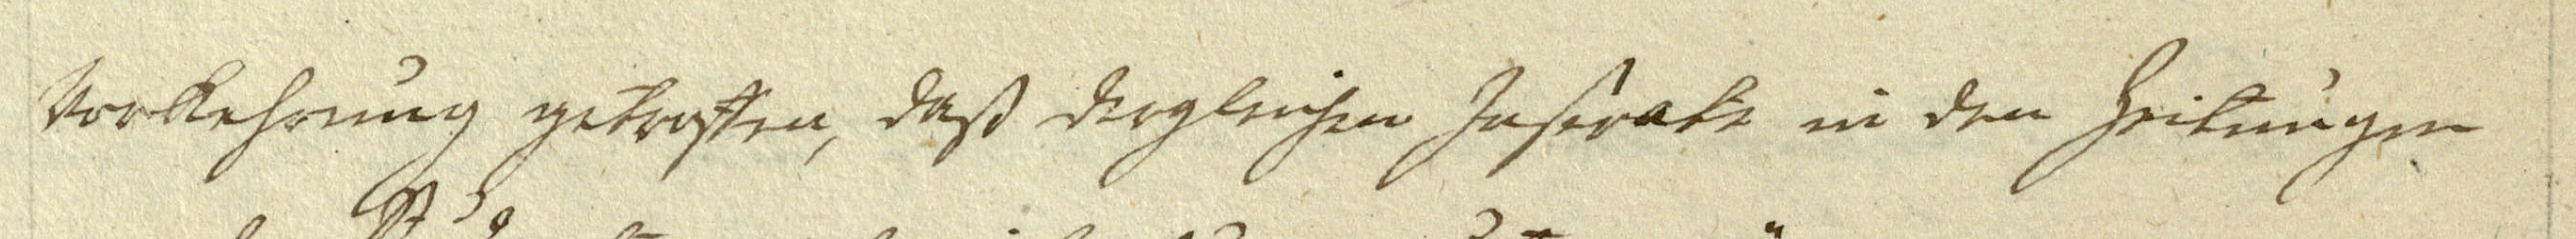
Vorkehrung getroffen, daß dergleichen Inserate in den Zeitungen
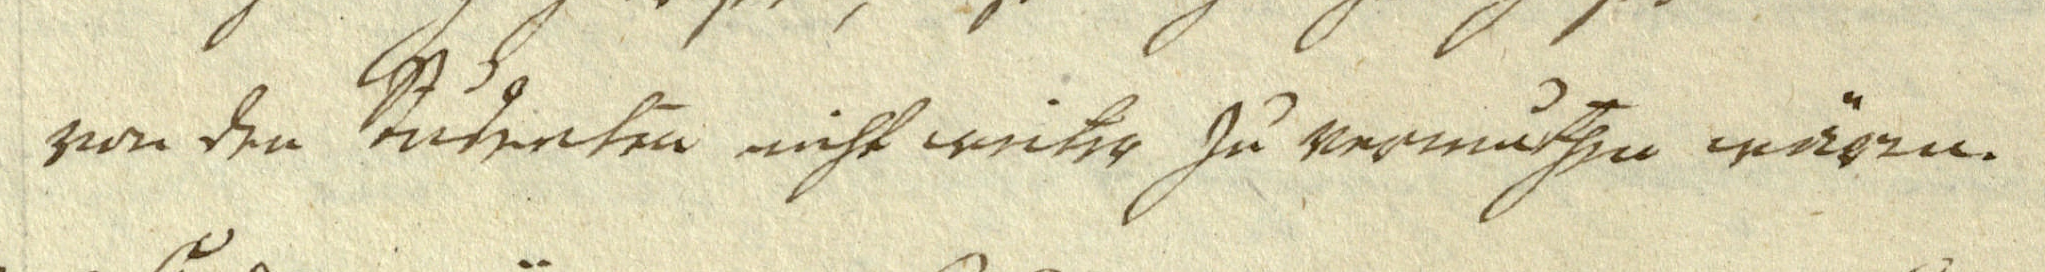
von den Studenten nicht weiter zu vermuthen wären.
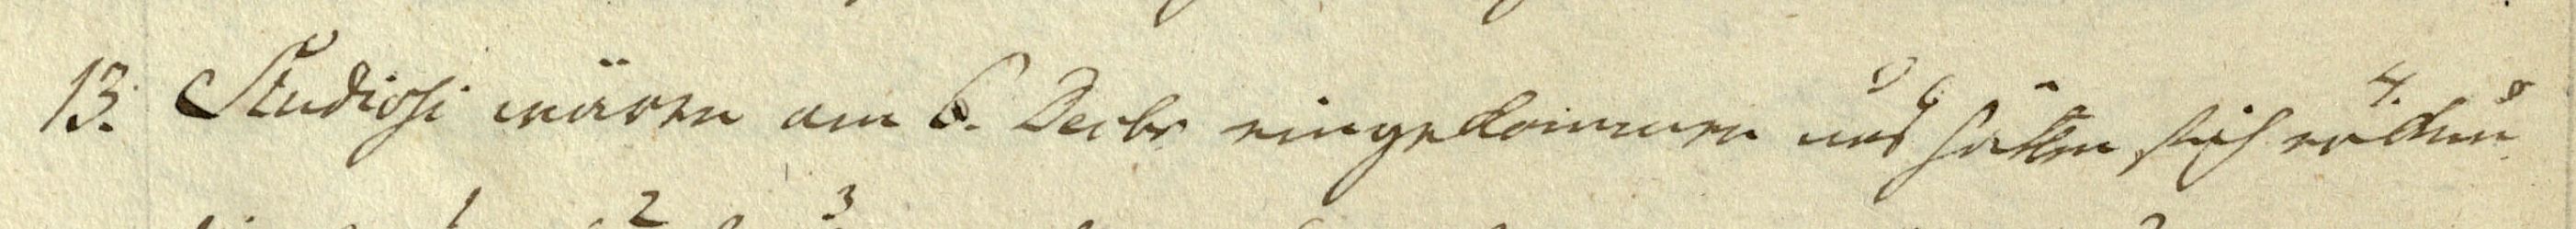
13. Studiosi wären am 6. Decbr. eingekommen und hätte sich erkun¬
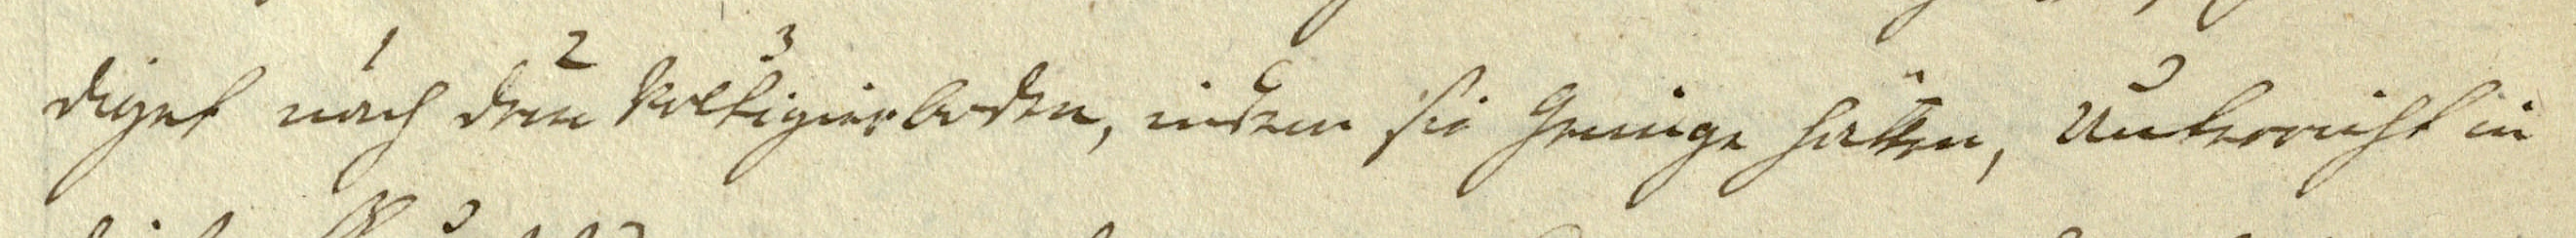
diget nach dem Voltigierboden, indem sie Genüge hätten, Unterricht in
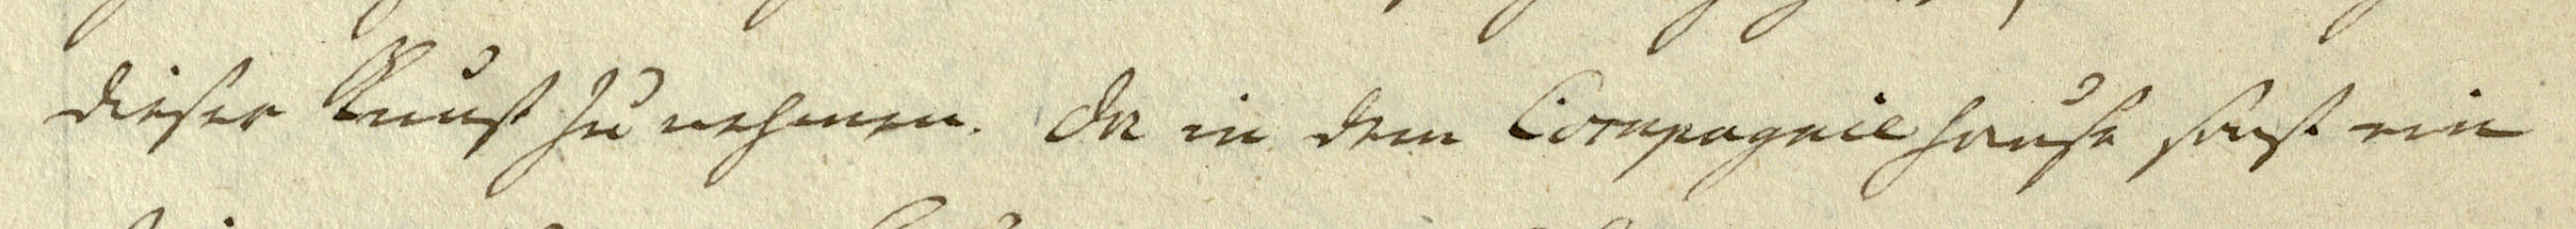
dieser Kunst zu nehmen. Da in dem Compagniehause sonst ein
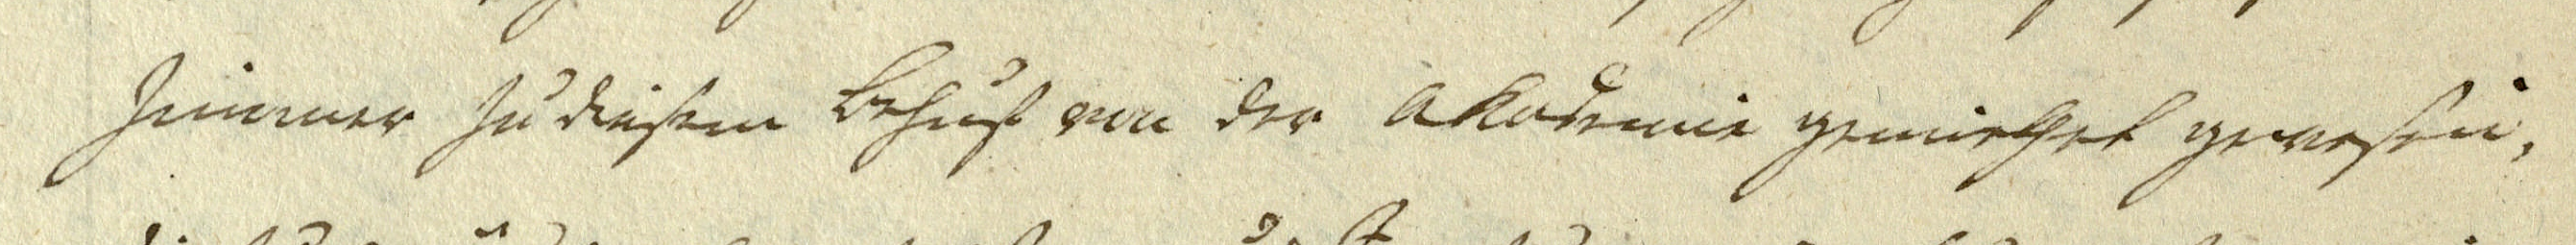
Zimmer zu diesem Behuf von der Akademie gemiethet gewesen,
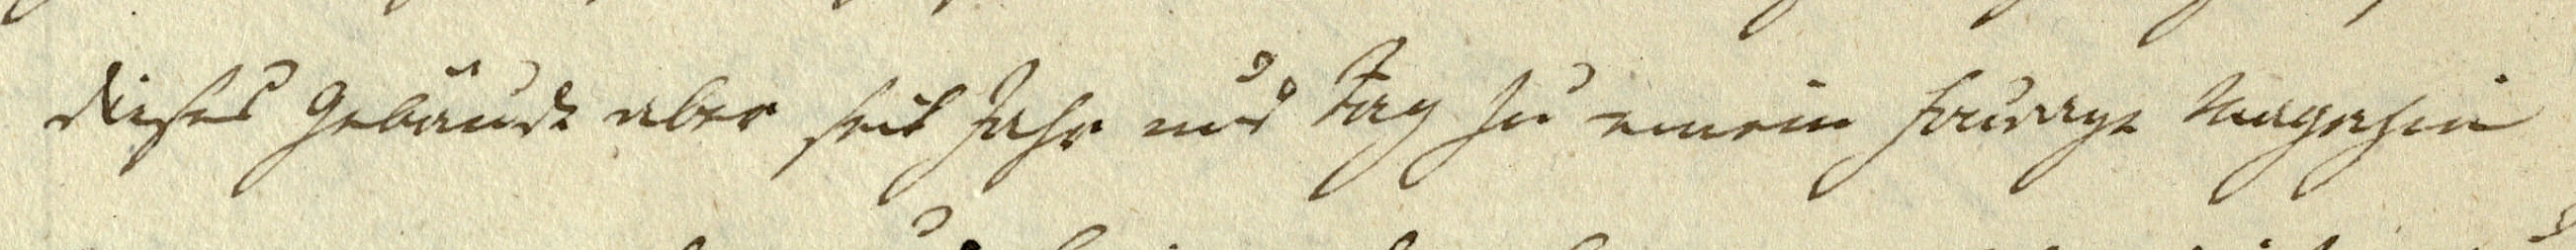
dieses Gebäude aber seit Jahr und Tag zu einem Fourage Magazin
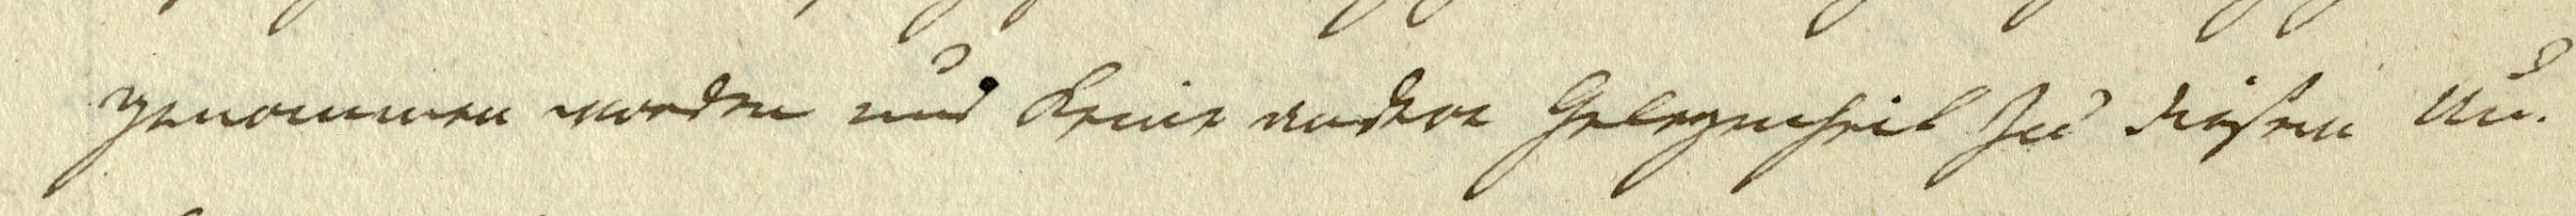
genommen worden und keine andere Gelegenheit zu diesem Un¬
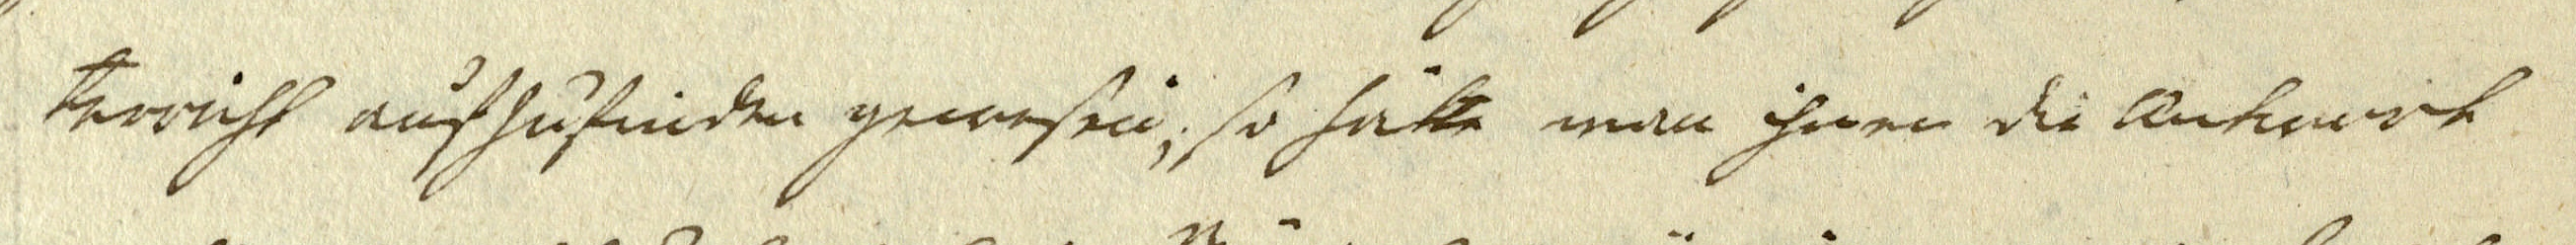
terricht aufzufinden gewesen, so hätte man ihnen die Antwort
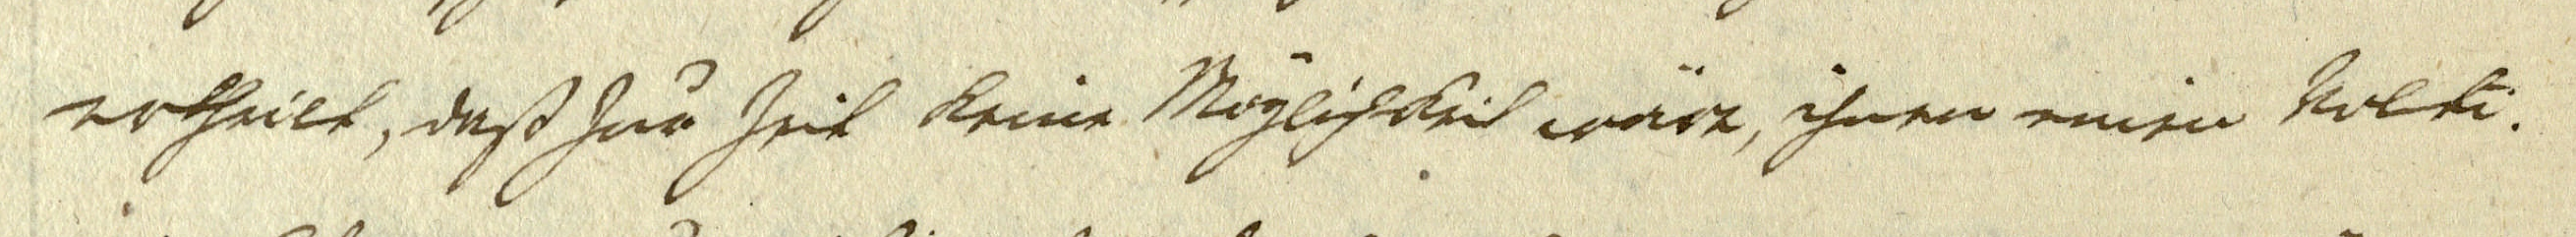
ertheilt, daß zur Zeit keine Möglichkeit wäre, ihnen einen Volti¬
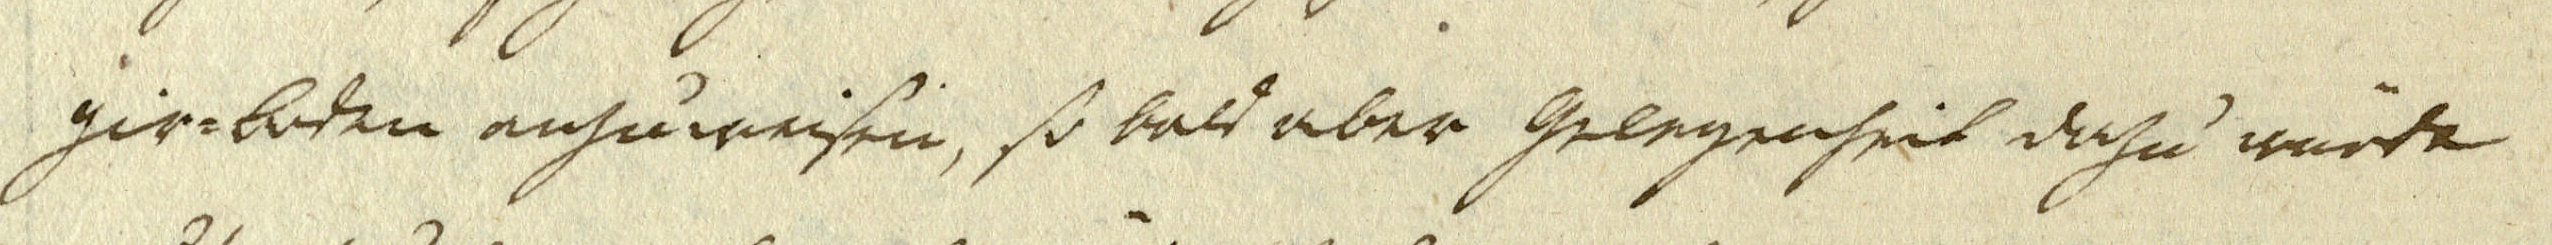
gir-Boden anzuweisen, so bald aber Gelegenheit dazu würde
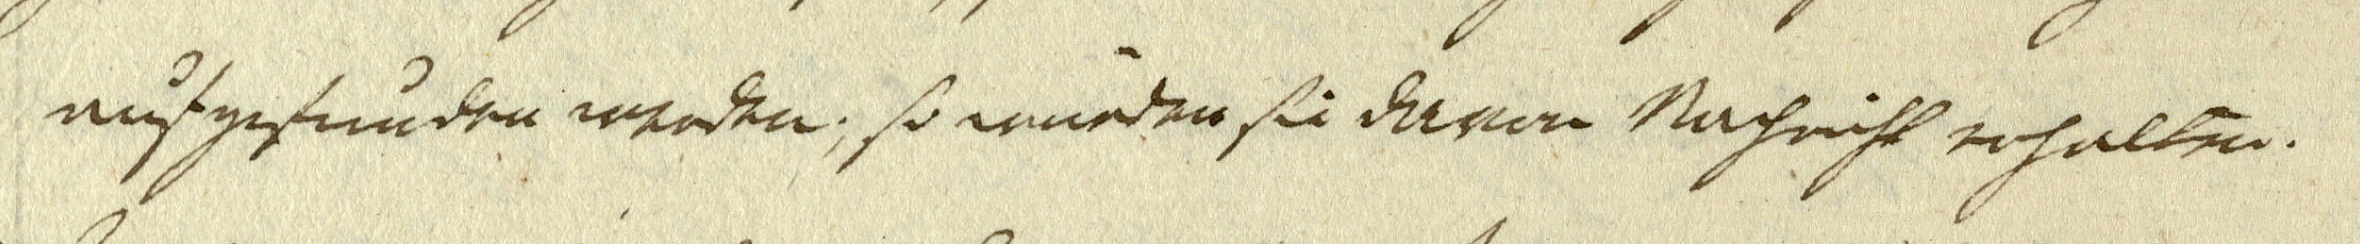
aufgefunden werden, so werden sie davon Nachricht erhalten.
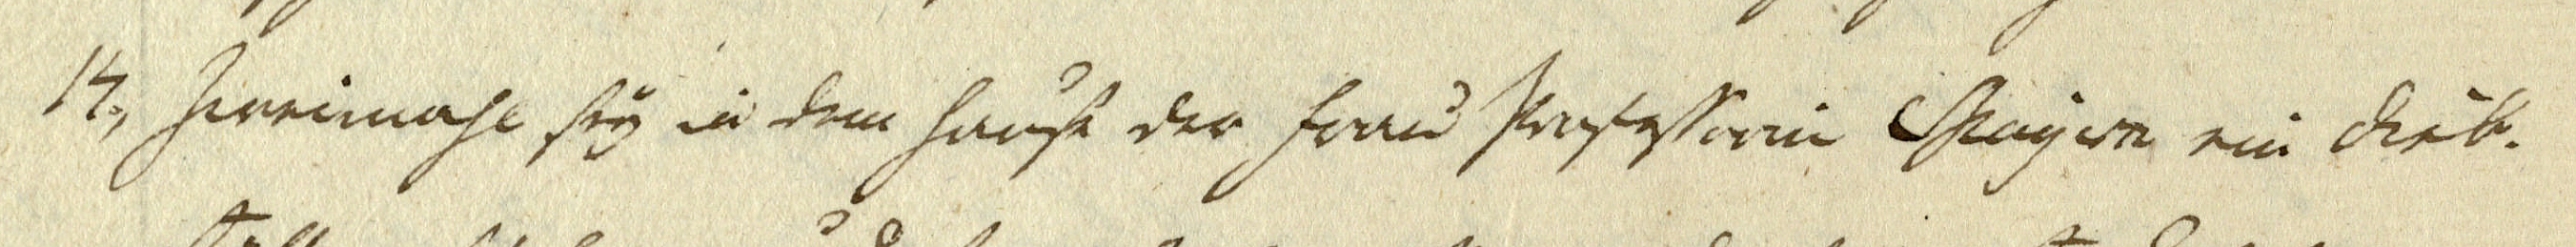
14., Zweimahl seÿ in dem Hause der Frau Professorin Maÿern ein Dieb¬
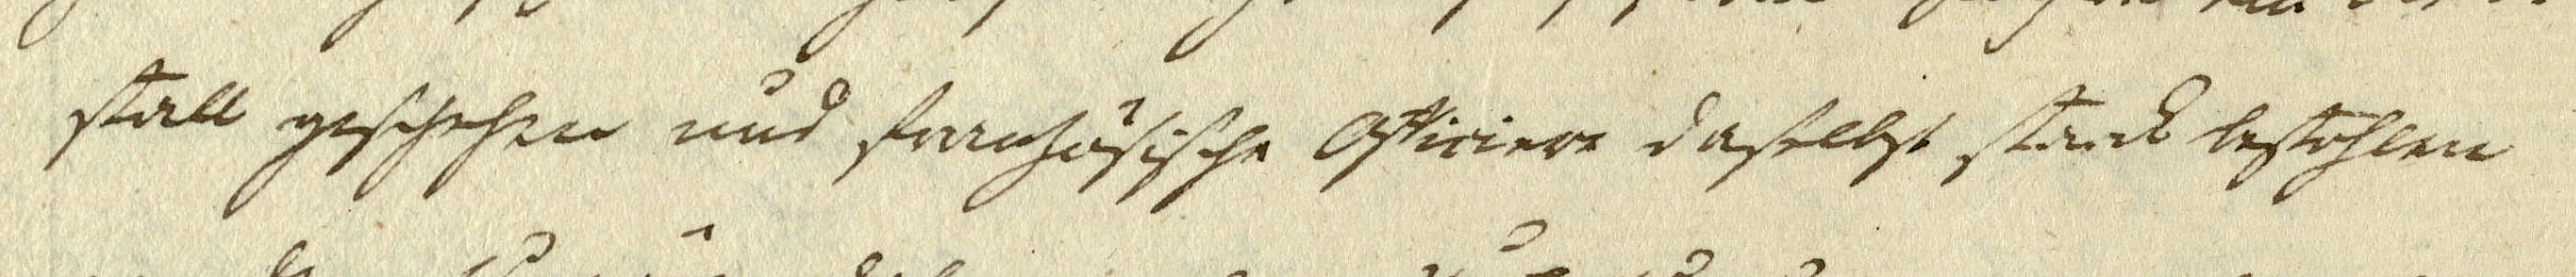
stahl geschehen und französische Officiere daselbst starck bestohlen
